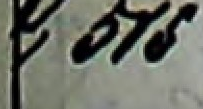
0,515
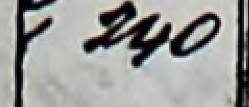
0,240
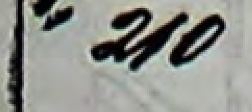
1,210
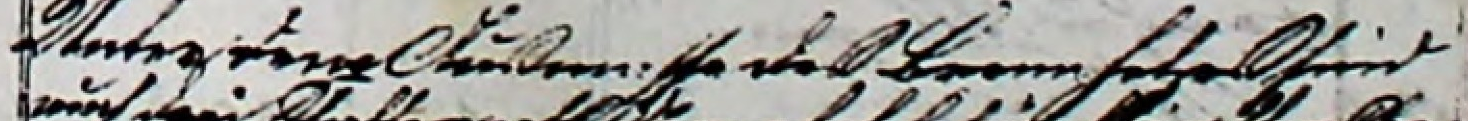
Unter dem Ausmesse des Brennholzes sind
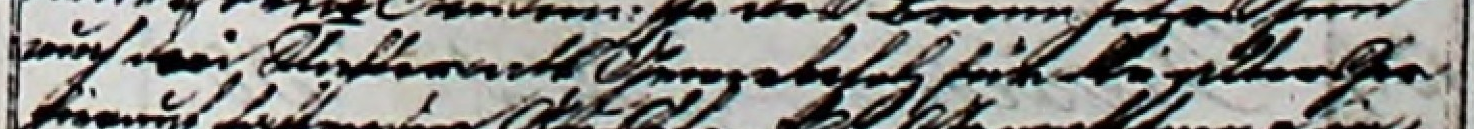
auch die Klafter als Genebeholz für die alters her
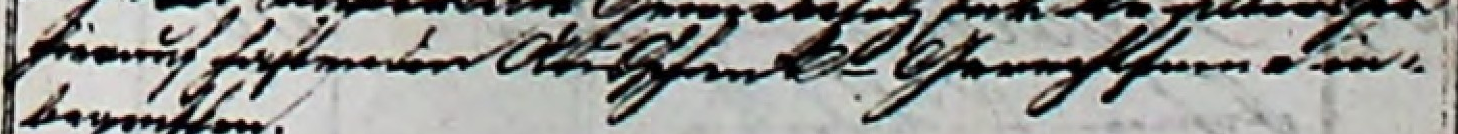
hierauf haften den Ausschank Gerechtsame in
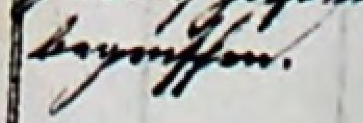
begriffen.
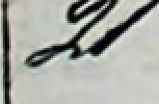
21
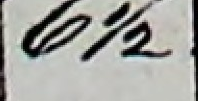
6 ½
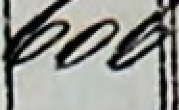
606
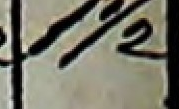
1 ½
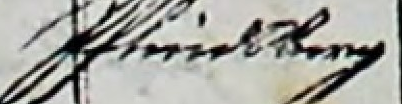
Pflindsberg
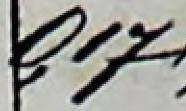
0,17
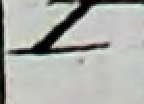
I
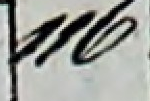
116
